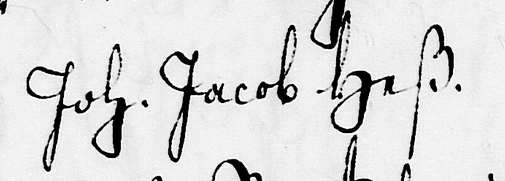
Joh. Jacob Heß.
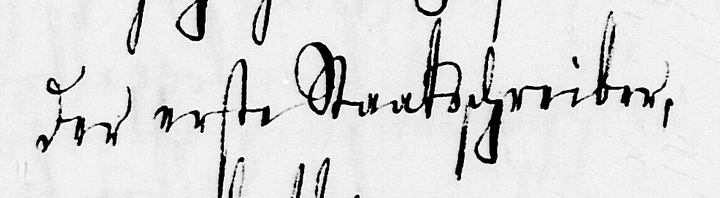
Der erste Staatsschreiber,
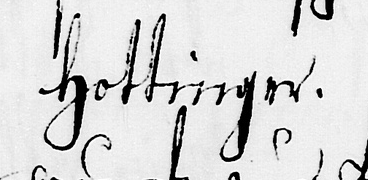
Hottinge¬
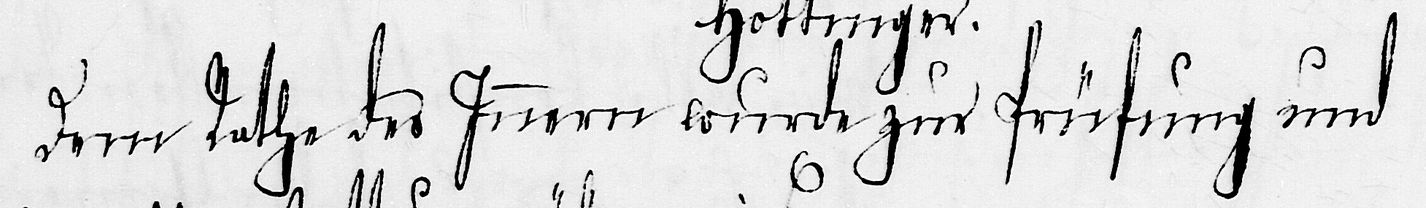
Dem Rathe des Innern wurde zur Prüfung und
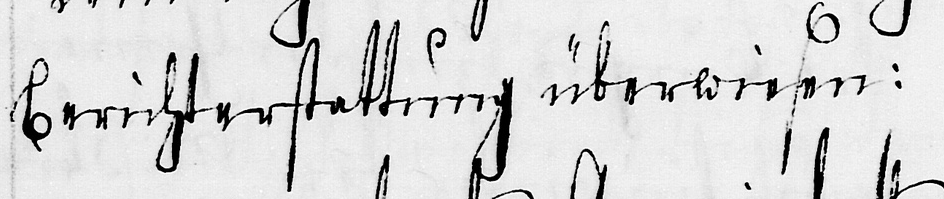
Berichterstattung überwiesen:
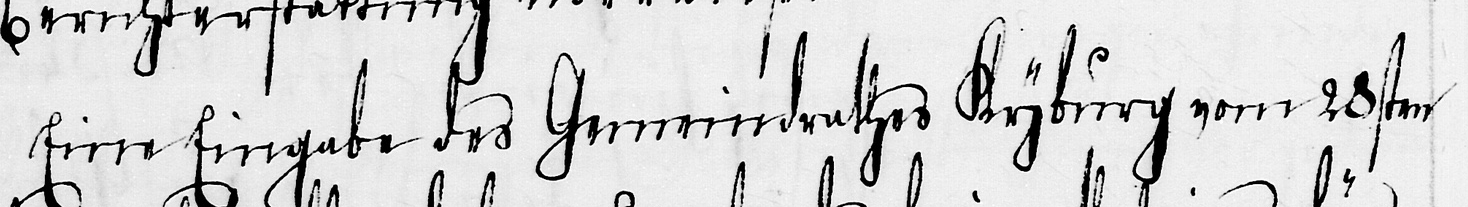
Eine Eingabe des Gemeindrathes Kyburg vom 28sten
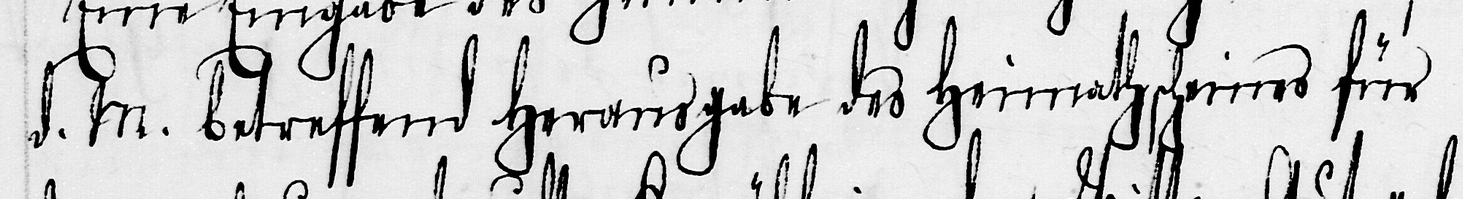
d. M. betreffend Herausgabe des Heimathscheines für
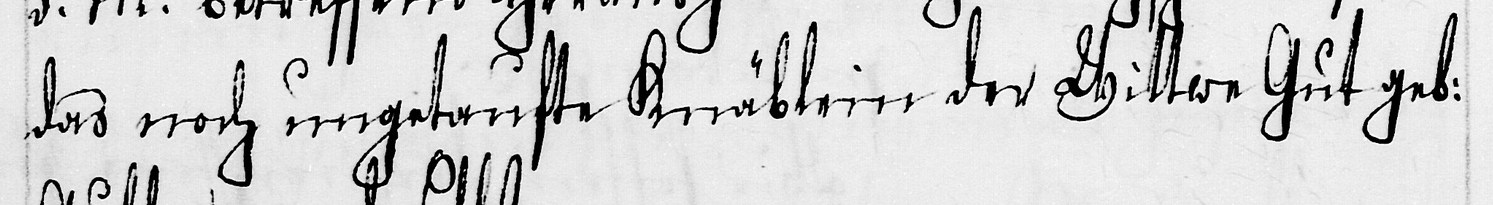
das noch ungetaufte Knäblein der Wittwe Gut geb:
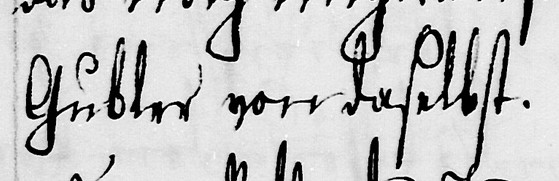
Gubler von daselbst.
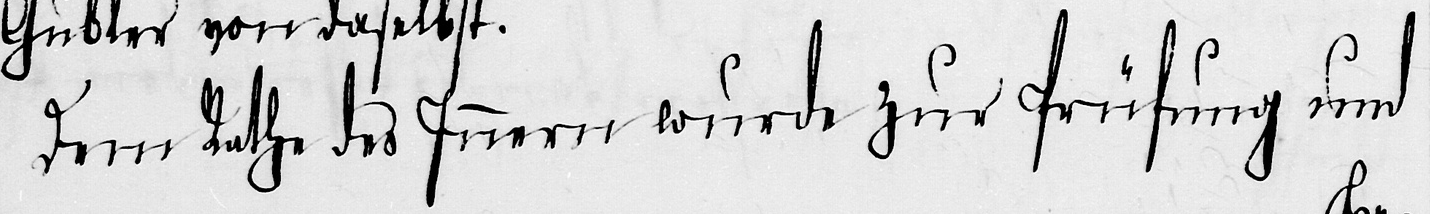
Dem Rathe des Innern wurde zur Prüfung und
